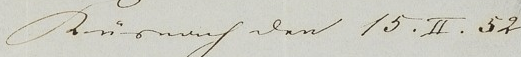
Küsnach den 15. II. 52
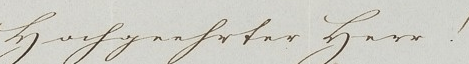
Hochgeehrter Herr!
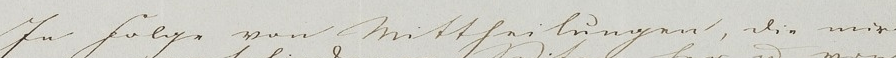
In Folge von Mittheilungen, die mir
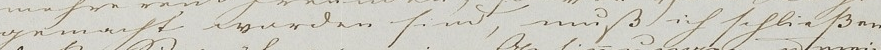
gemacht worden sind, muß ich schließen
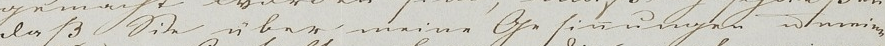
daß Sie über meine Gesinnungen u meine
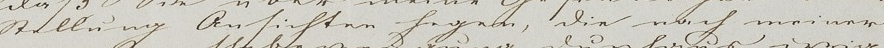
Stellung Ansichten hegen, die nach meiner
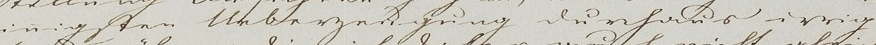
innigsten Ueberzeugung durchaus irrig
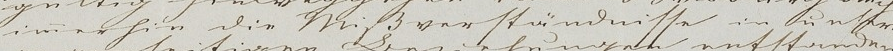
immerhin die Mißverständnisse in unsern
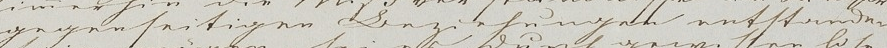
gegenseitigen Beziehungen entstanden
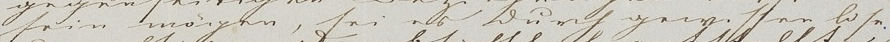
sein mögen, sei es durch gewissenlose,
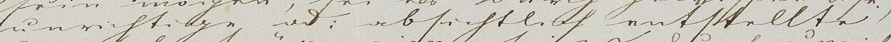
unrichtige od: absichtlich entstellte
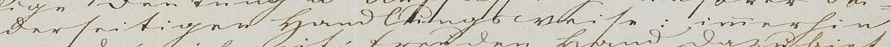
derseitigen Handlungsweise: immerhin
